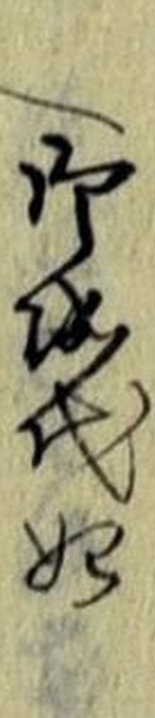御城代始
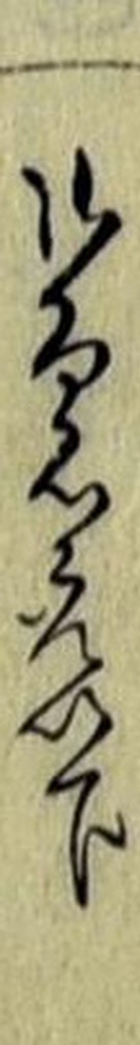弐百石取以下
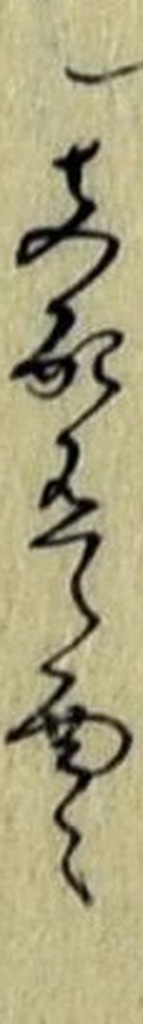支配有之面々
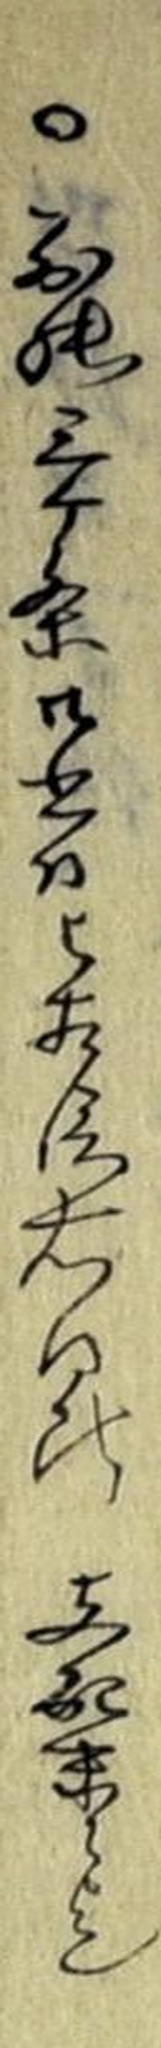○別紙三ヶ条御書付被相渡右同断支配末々迄
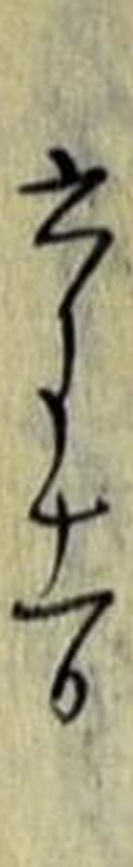六月十一日
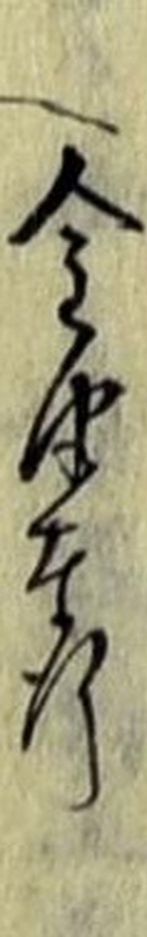金津奉行
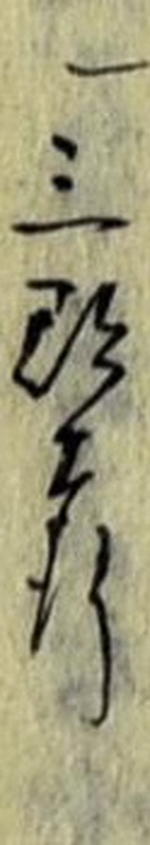三郡奉行
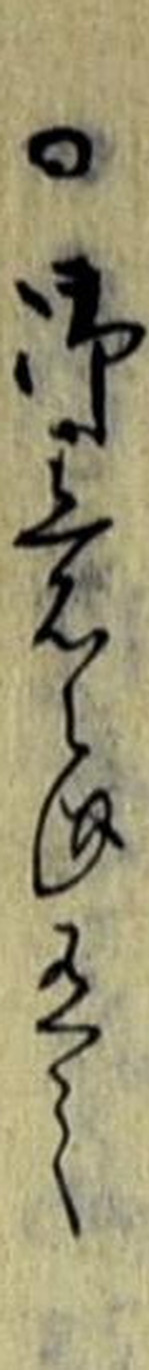○御意之趣有之
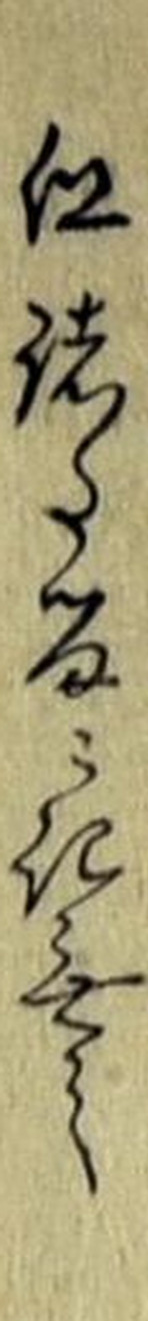但諸事留に記無之

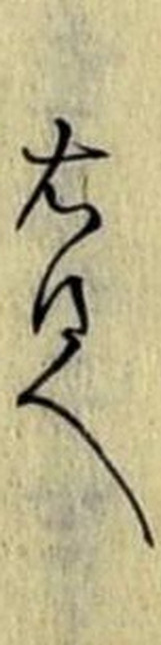右同人
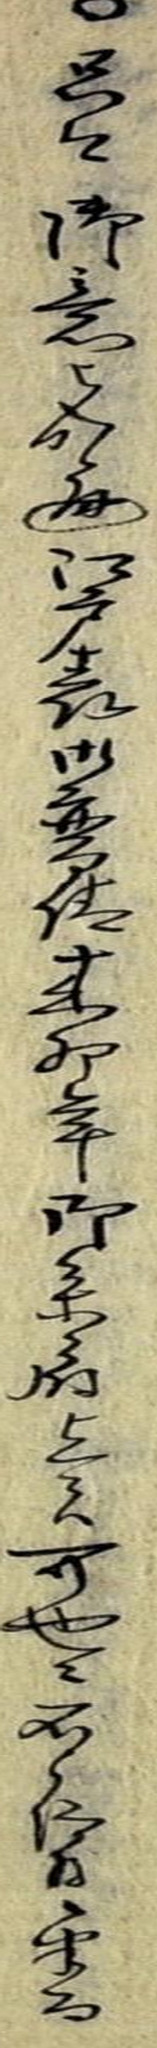○只今御意被成候通江戸表御普請来卯年御参府迄には可也に不被仰付候半而
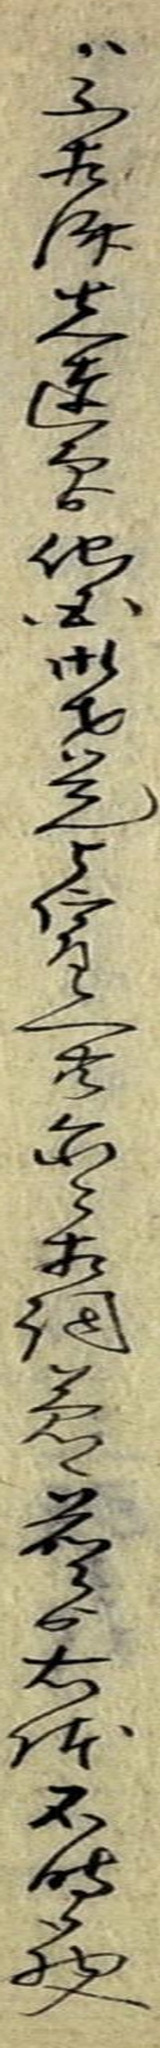は不相済先達而ゟ他国御才覚被仰付候へ共尓々相調兼候前々ゟ右体不時御物入
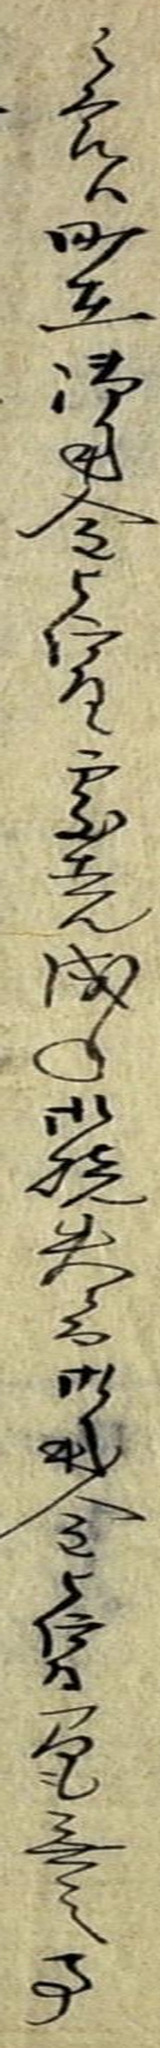之節は町在御用金被仰付候処去ル戌年御焼失に而御用金被仰付間も無之事
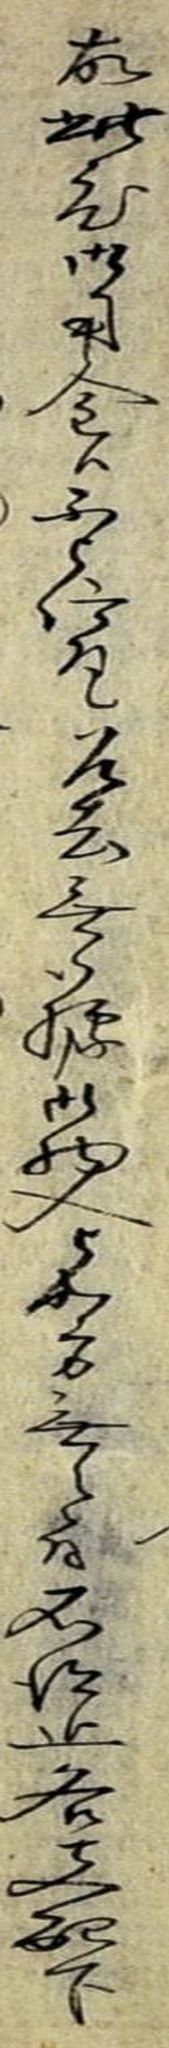故此度御用金は不被仰付候乍去無御拠御物入被成方無之に付不得止各支配下
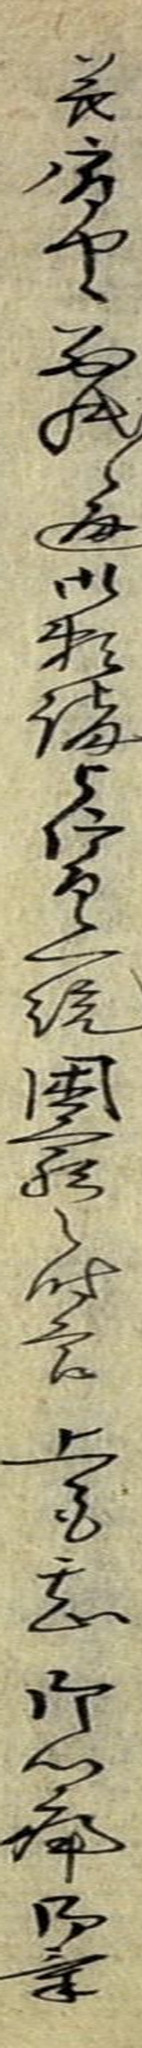并府中へ別紙之通御頼講被仰付候一統困窮之時節上にも甚御心痛御気
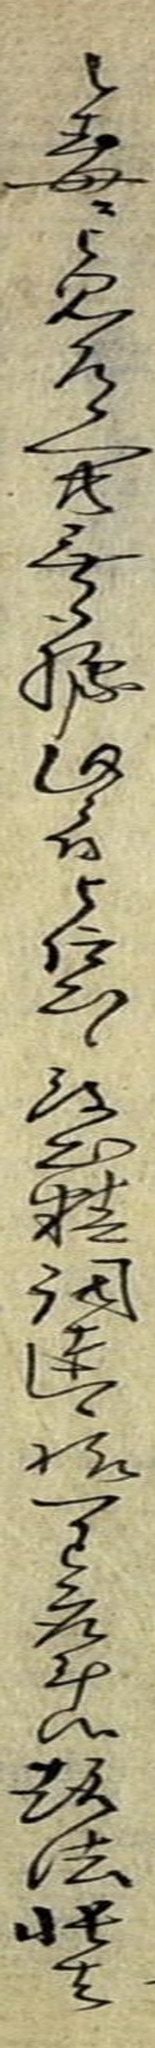之毒に被思召候へ共無御拠趣に付被仰出候致出精調達候様可被取斗候趣法帳は
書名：命令之部 四
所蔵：福井県文書館 Fukui Prefectural Archives
